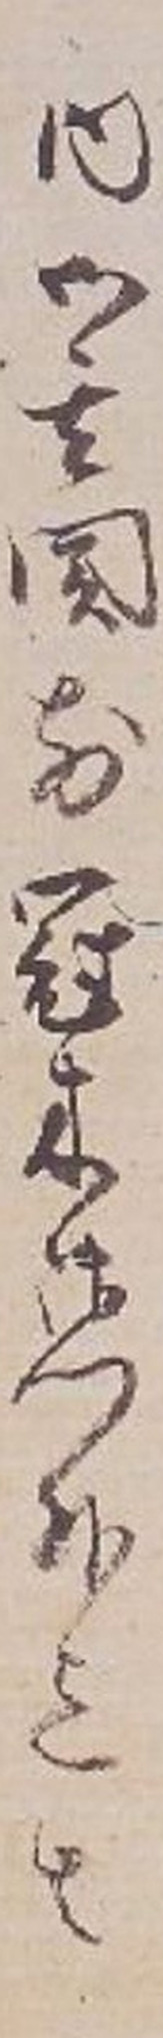内御玄関前冠木御門外迄者

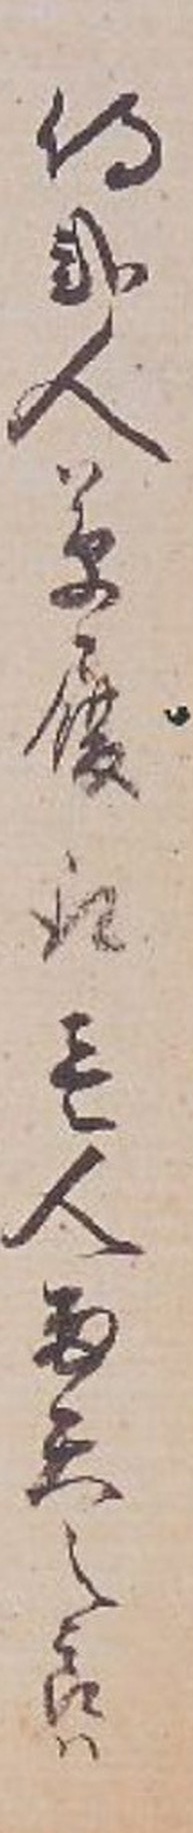侍弐人草履取壱人雨天之節ハ
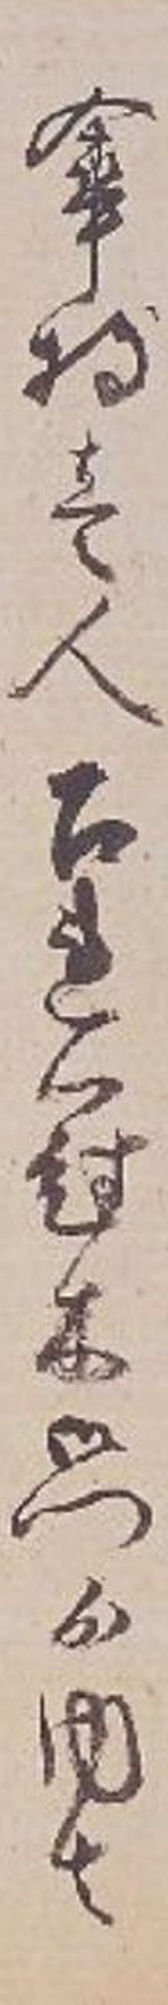傘持壱人召連冠木御門ゟ内者
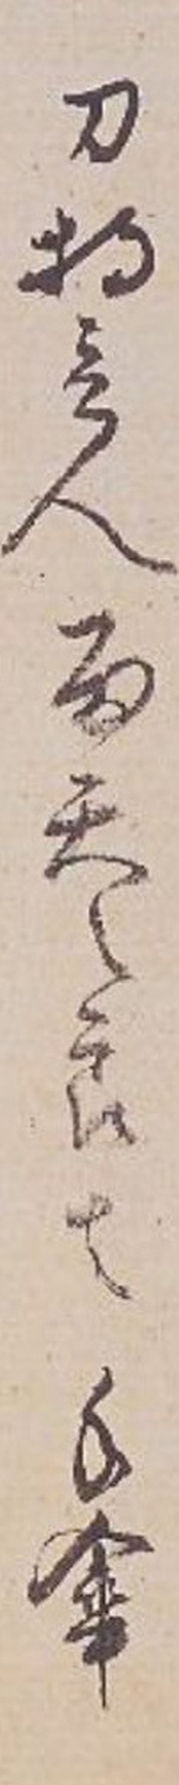刀持壱人雨天之節者手傘
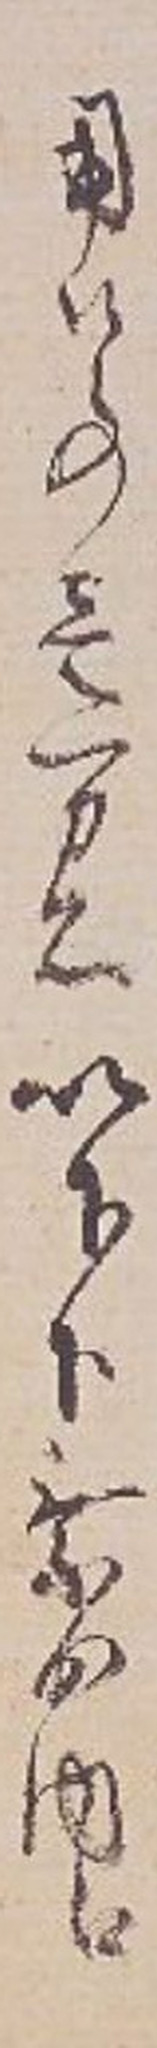用候事壱万石以下下乗ゟ内え
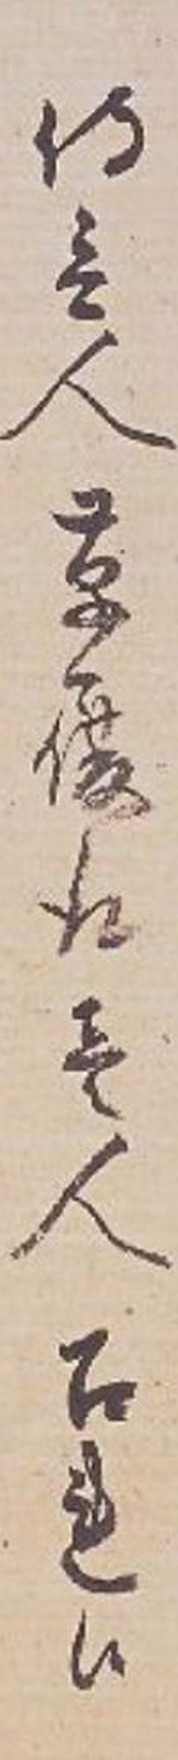侍壱人草履取壱人召連候
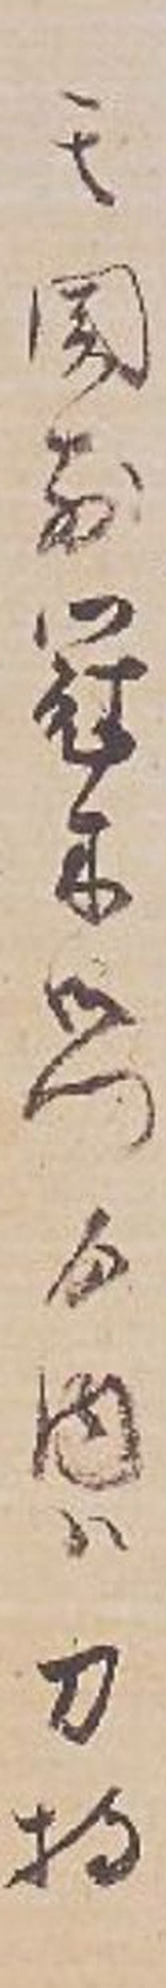其関前冠木御門ゟ内ハ刀持
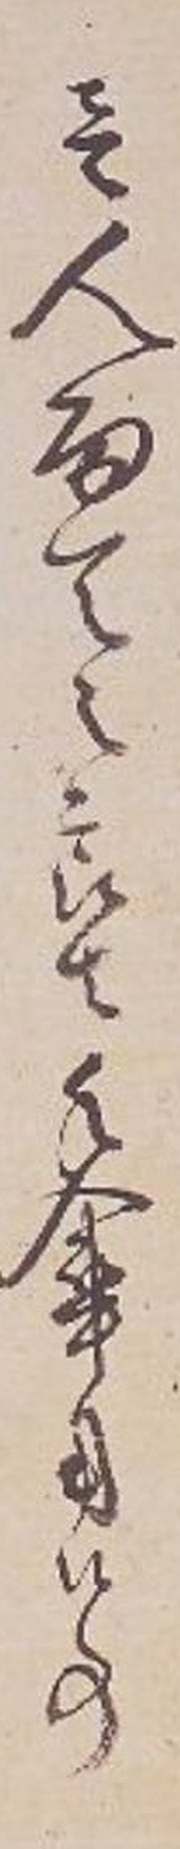壱人雨天之節者手傘用候事
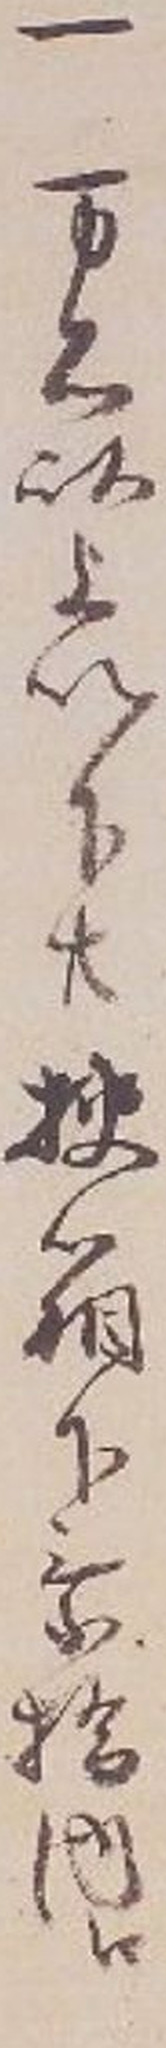一万石以上以下共挟箱下乗橋内え
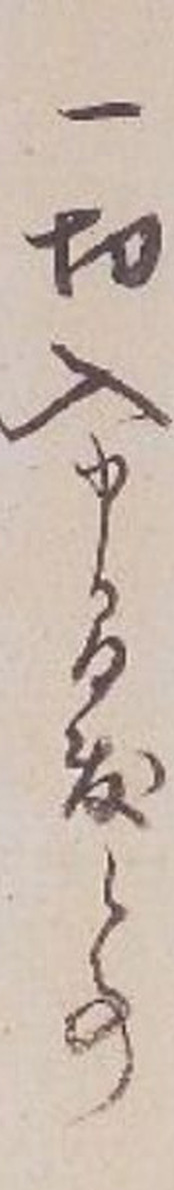一切入申間敷候事
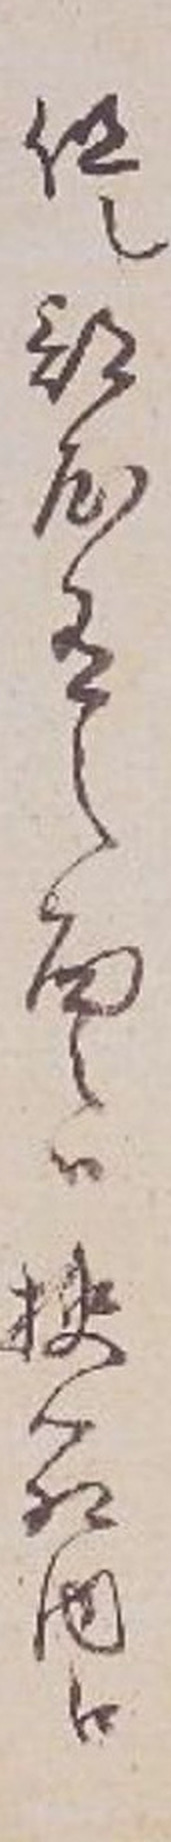但し部屋有之面々ハ挟箱内え
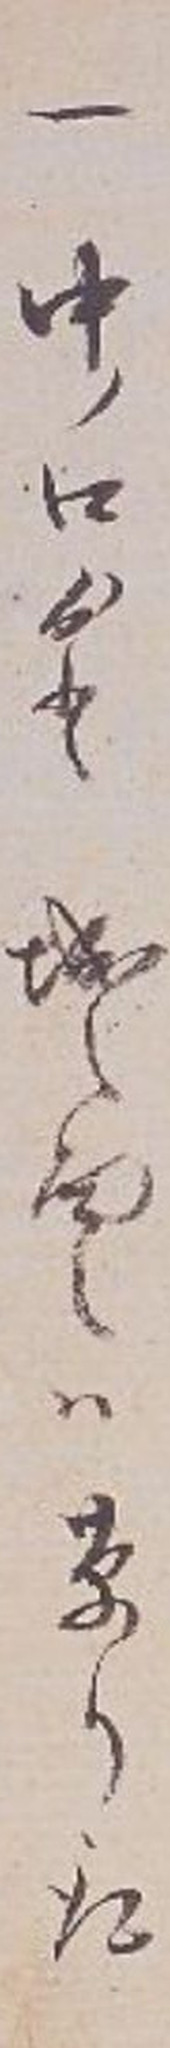一中ノ口ゟ登城之面々ハ草り取

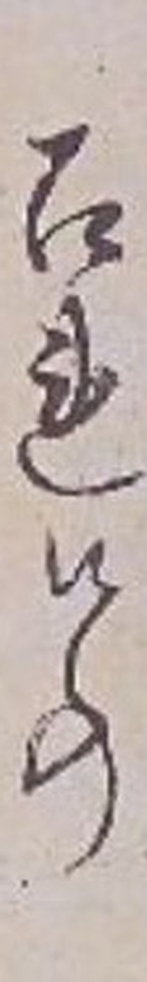召連候事
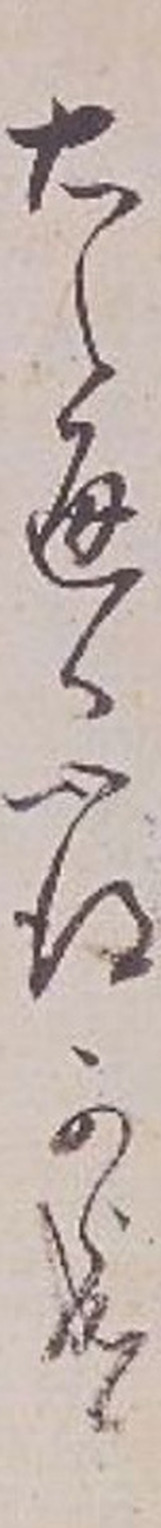右之通り心得可被成候
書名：琉球人来朝記 一、二
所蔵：University of the Ryukyus Library
